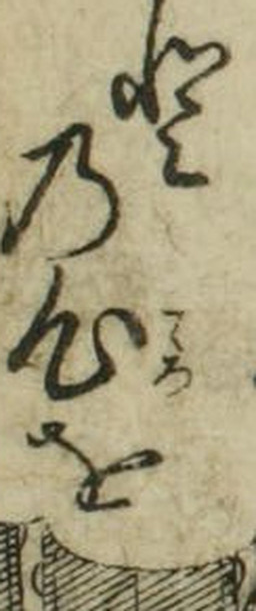の心を
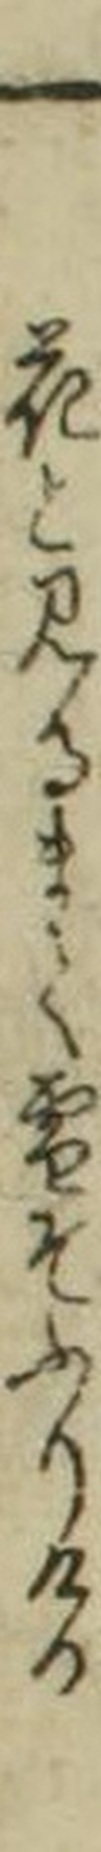花と見るまて雪そふりける

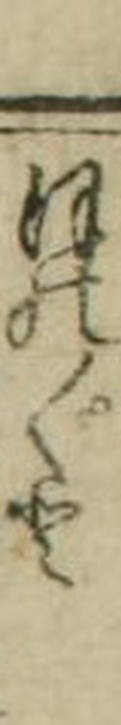ほの〴〵と
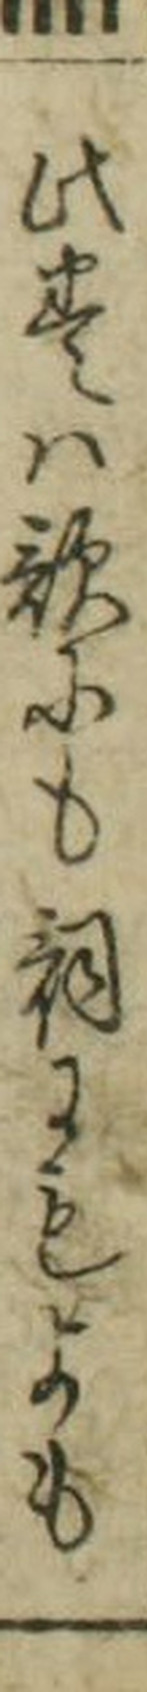此巻は歌にも詞にもよも
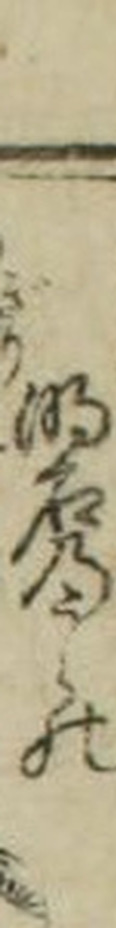明石のうらの
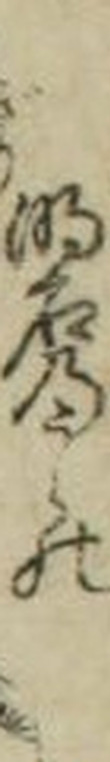明石のうらの
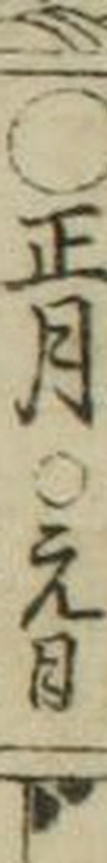○正月○元日
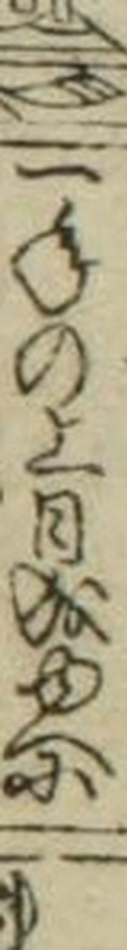一年の上日成ゆへに
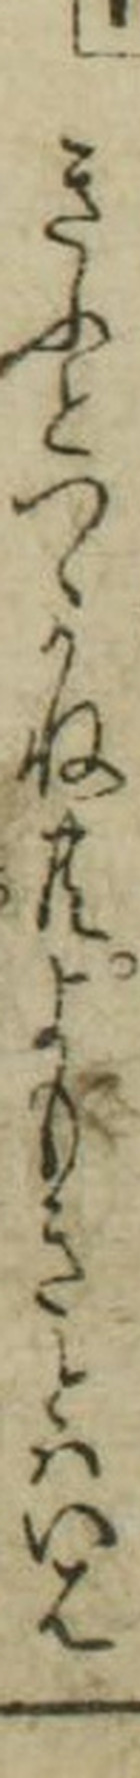きふとつかね共。よもきとはいは
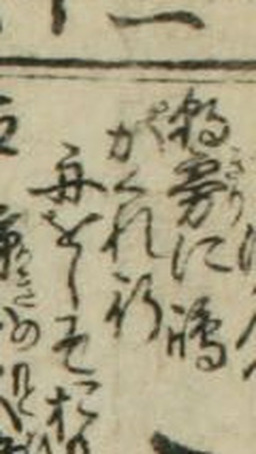がくれ行
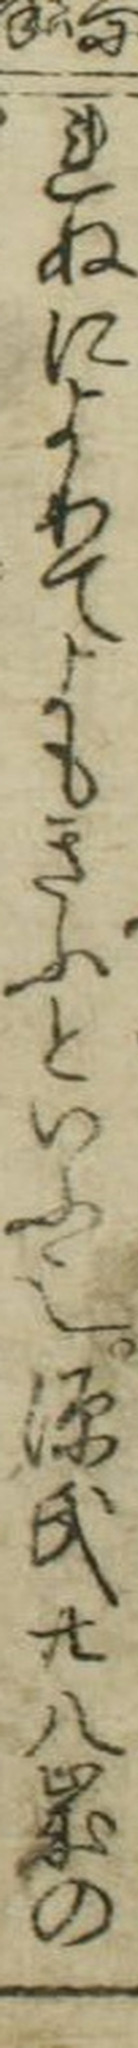れぬによりてよもきふといふ也。源氏廿八歳の
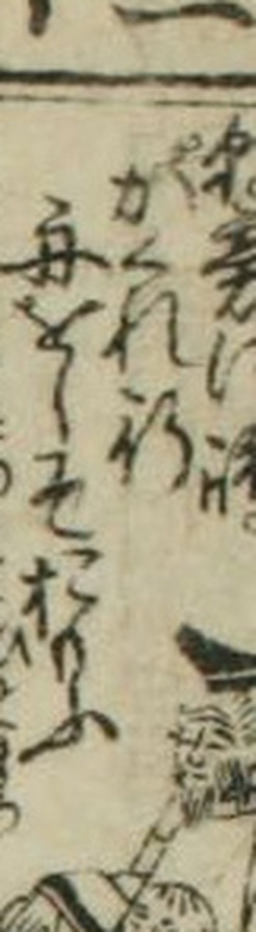舟をしそおもふ
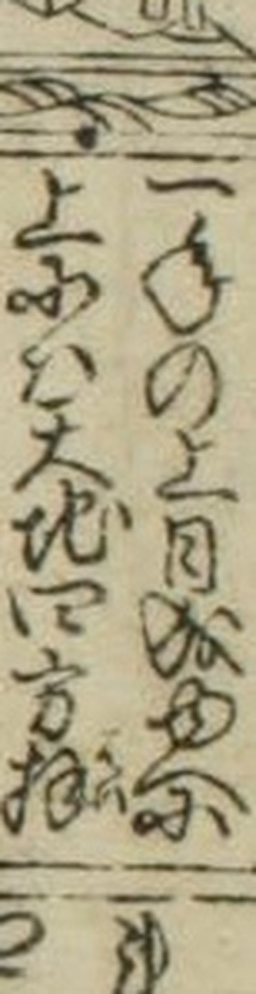上には天地四方拝
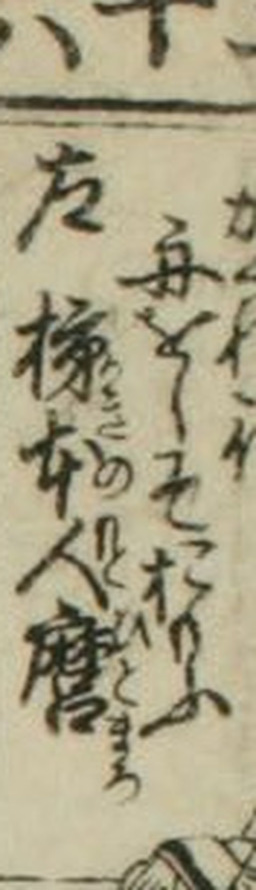左柿本人麿
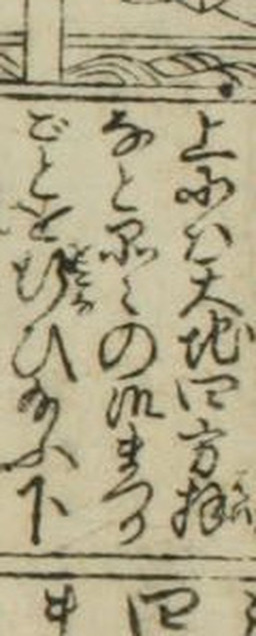なと品々の御まつり
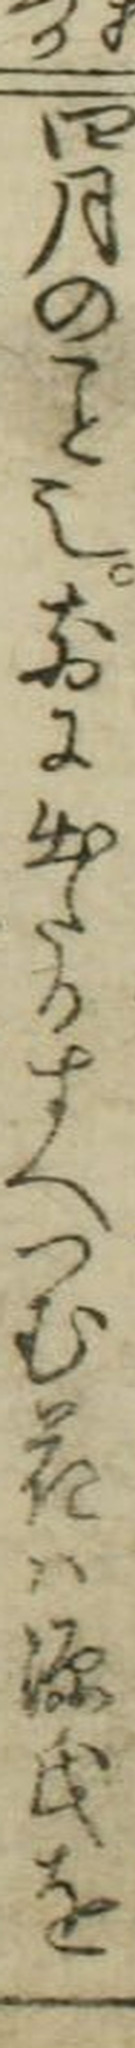四月のこと也。前に出たるすへつむ花は源氏を
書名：女源氏教訓鑑
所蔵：東京学芸大学附属図書館
